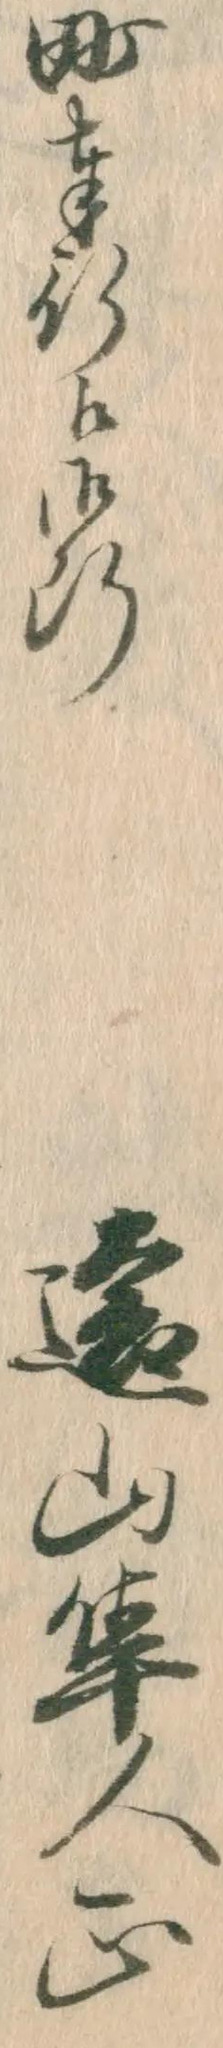│町奉行え御断遠山隼人正
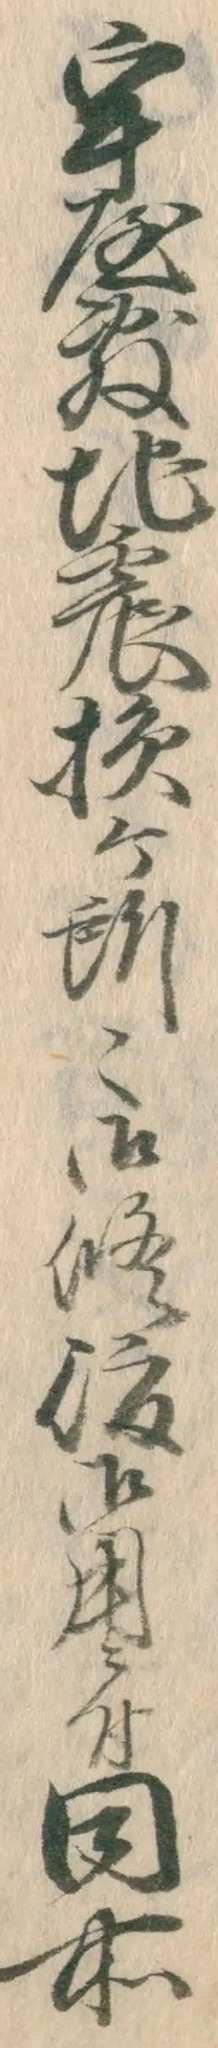牢屋敷地震損ケ所〻御修復御用ニ付同所
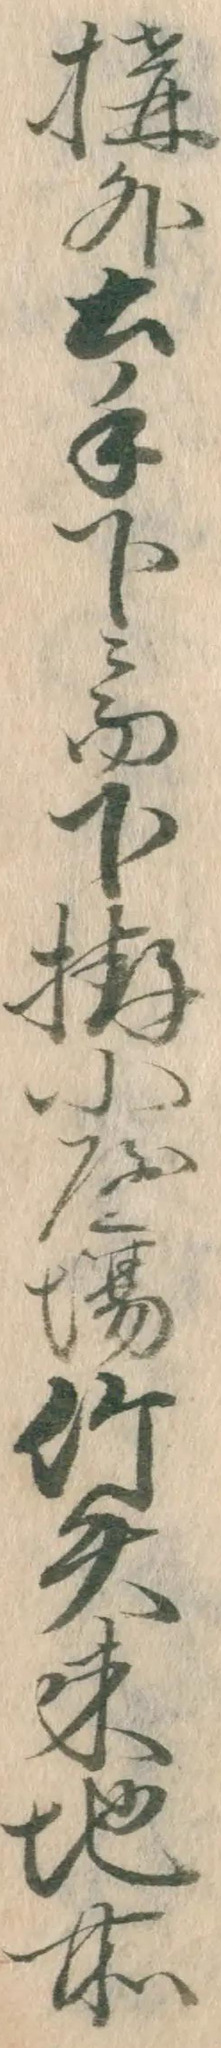構外土手下ニて下拵小屋場竹矢来地所

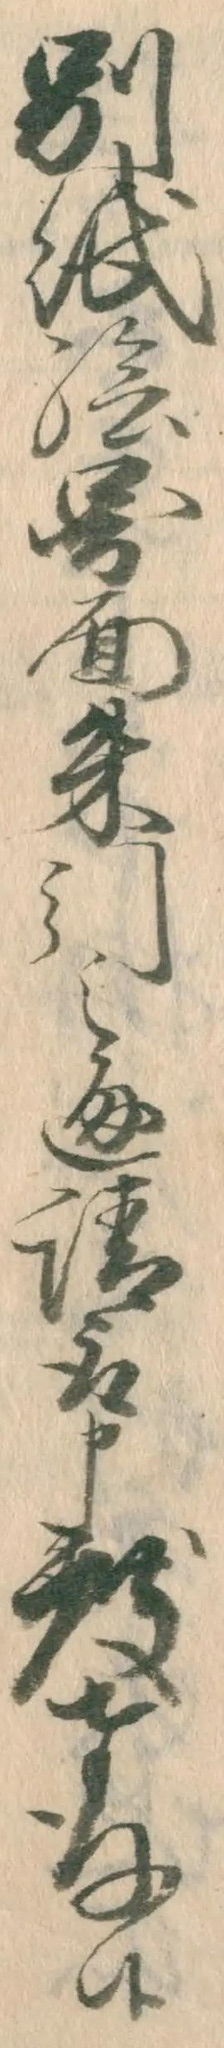別紙絵図面朱引之通請取申致奉存候
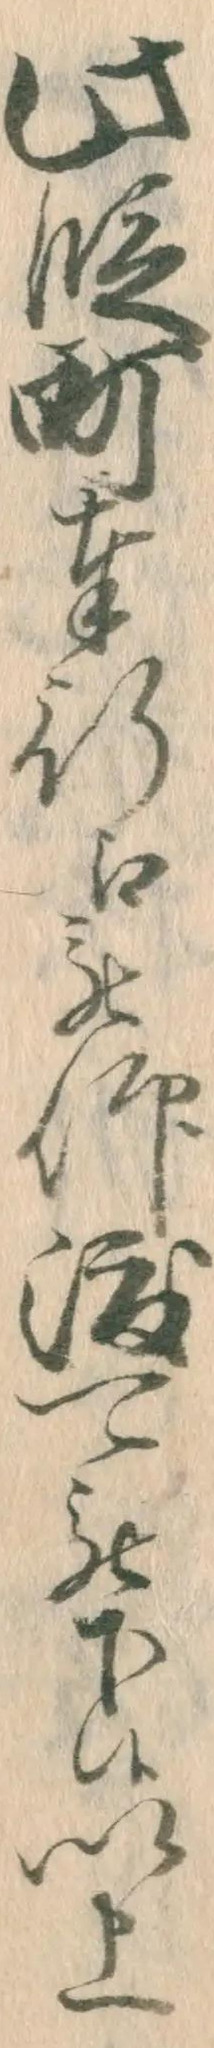此段奉行え被仰渡可被下候以上
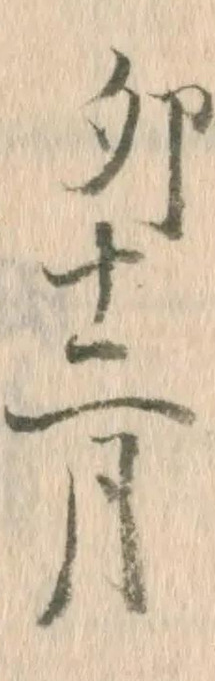卯十二月
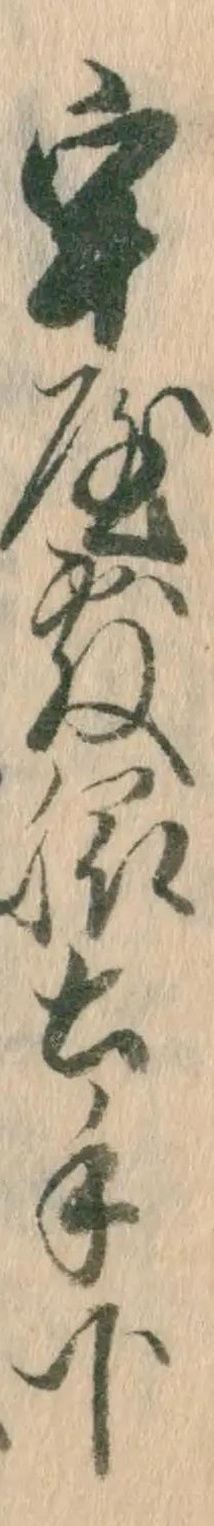牢屋敷脇土手下
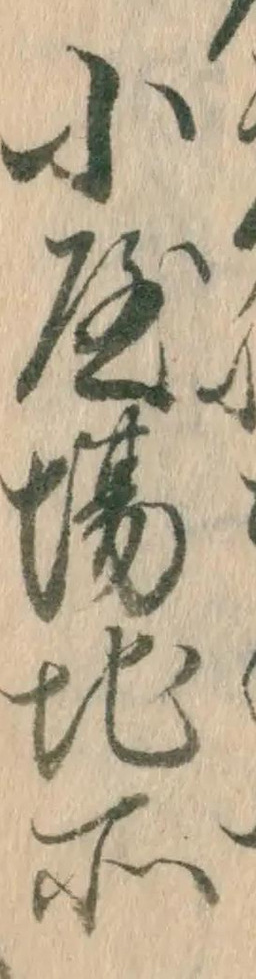小屋場地所
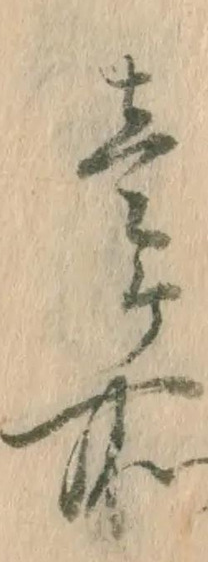壱ケ所

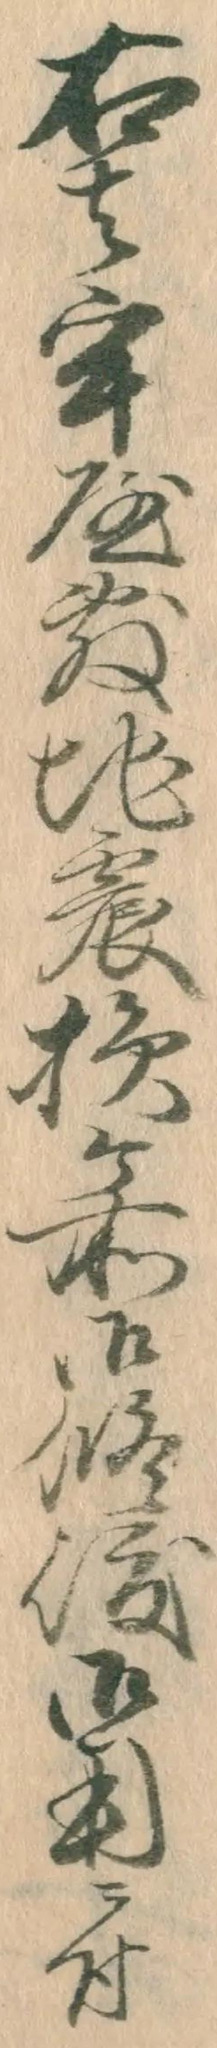右は牢屋敷地震損ケ所御修復御用ニ付
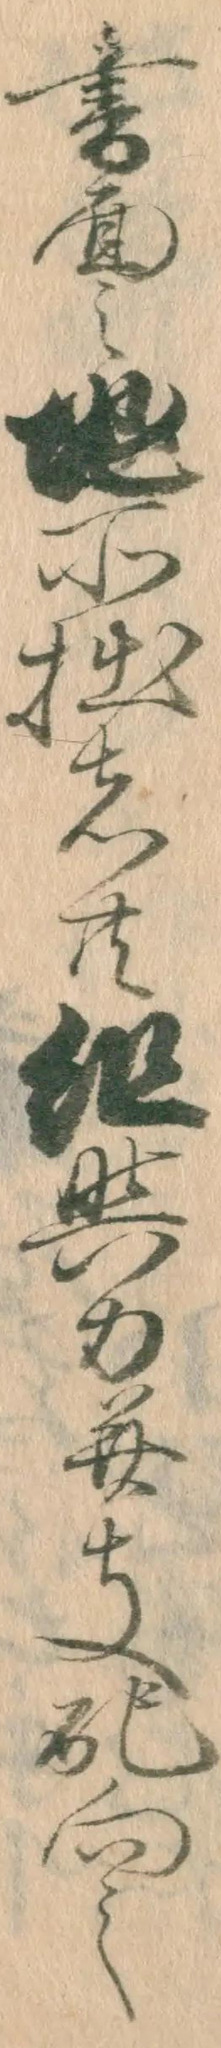書面之地所拙者共組与力幷支配向之
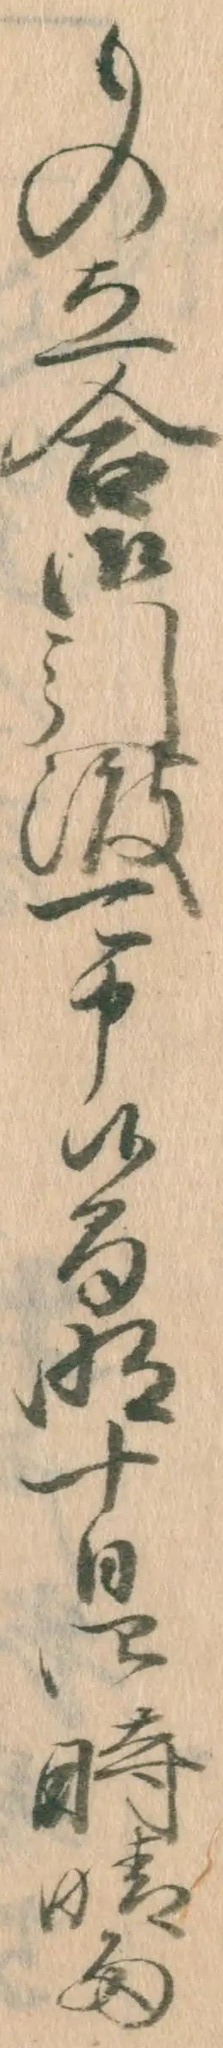もの立合御引取可申候間明十日四時晴雨
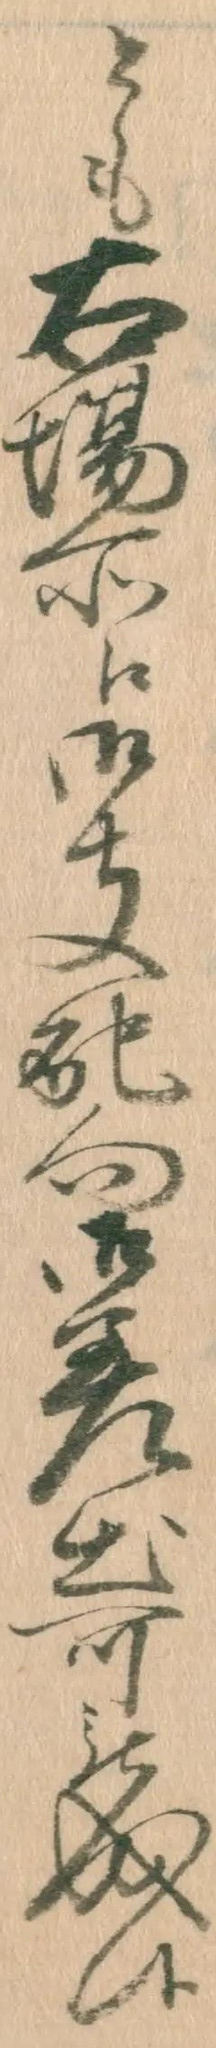とも右場所え御支配向御差出可被成候
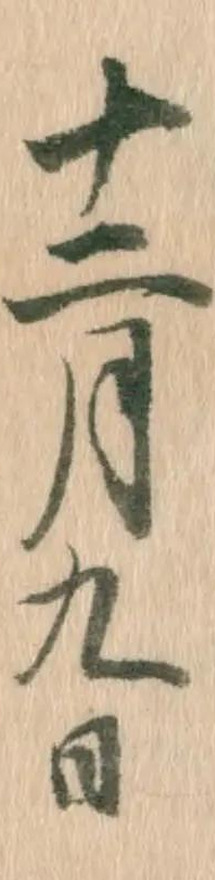十二月九日
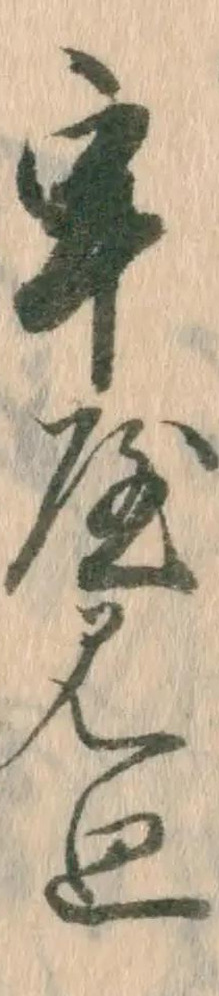│牢屋見廻
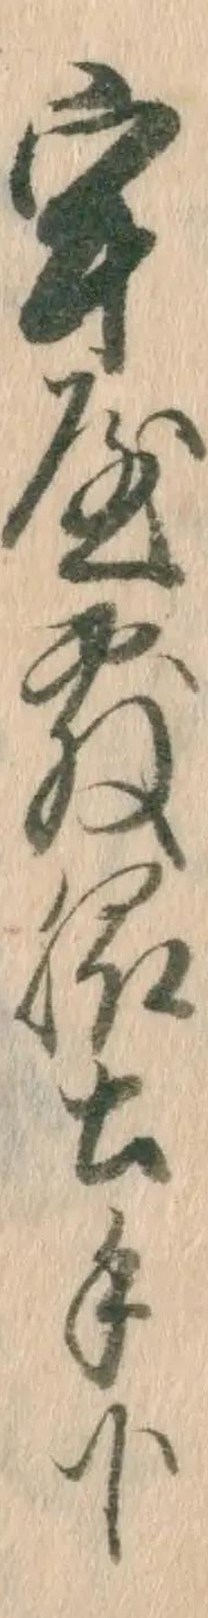牢屋敷脇土手下
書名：七十冊物類集 71巻. [44] 四十三 牢屋敷御普請御修覆地震ニ付骨折候牢屋掛御褒美之部
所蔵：国立国会図書館 National Diet Library, JAPAN
